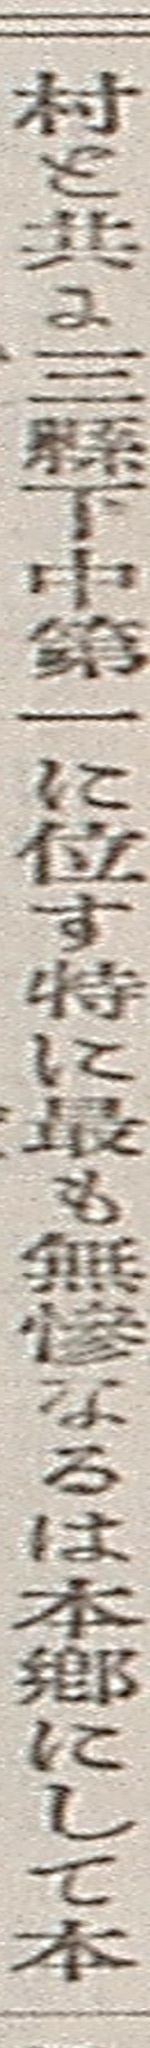村と共に三県下中第一に位す特に最も無惨なるは本郷にして本
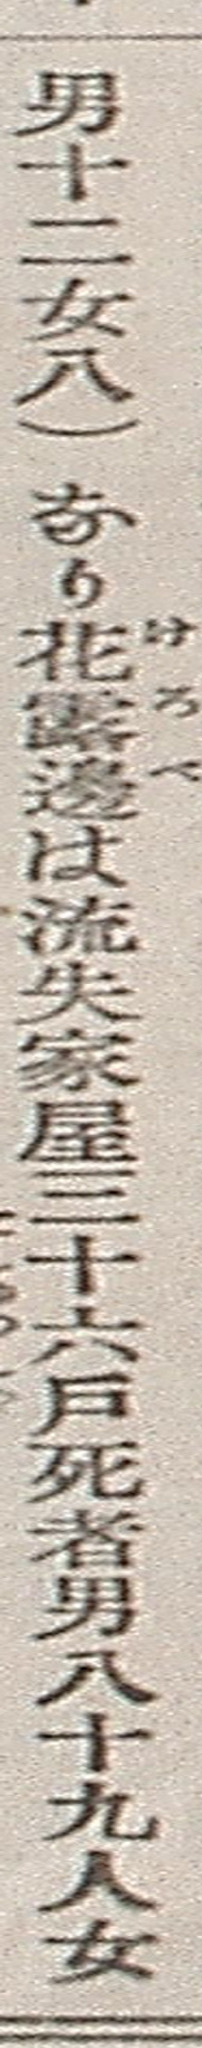男十二女八）なり花露辺は流失家屋三十六戸死者男八十九人女
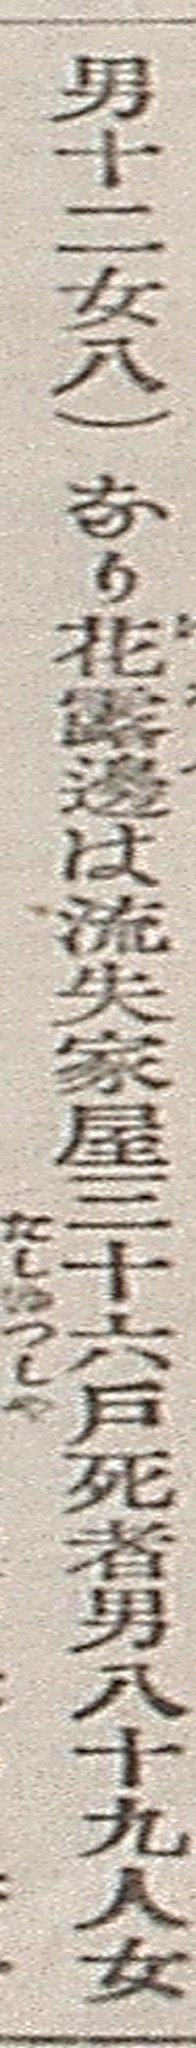男十二女八）なり花露辺は流失家屋三十六戸死者男八十九人女
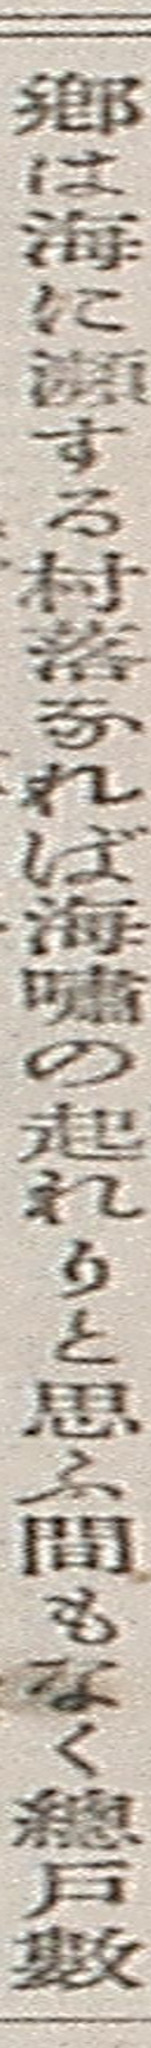郷は海に瀕する村落なれば海嘯の起れりと思ふ間もなく総戸数
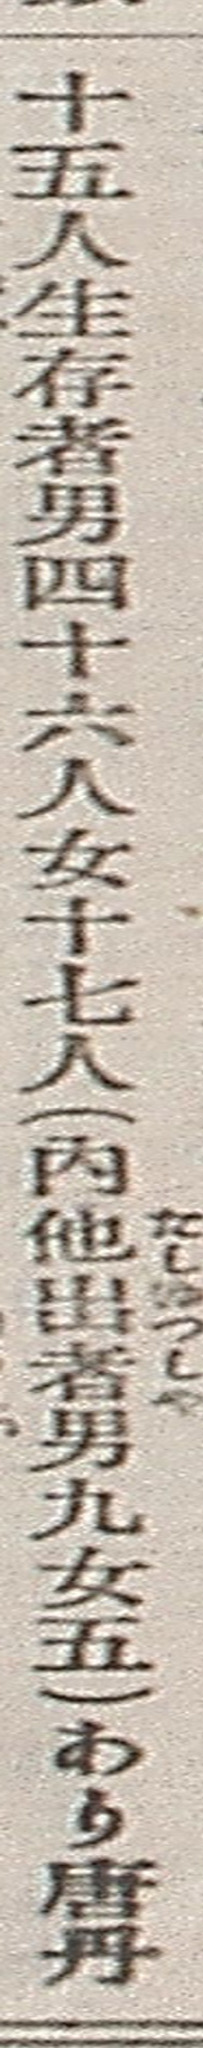十五人生存者男四十六人女十七人男九女五）あり唐丹
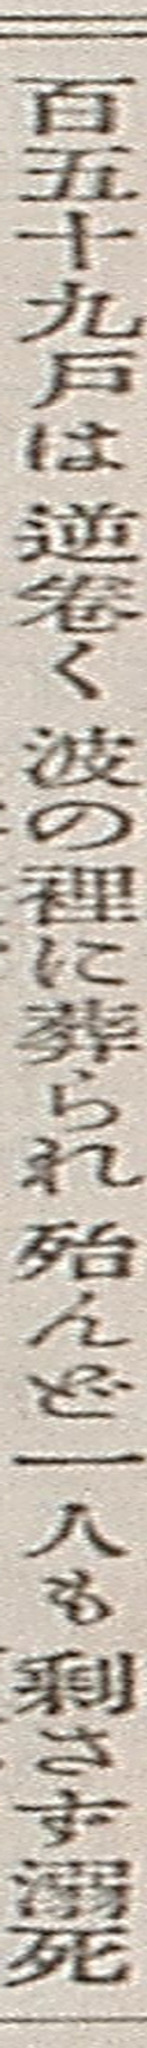百五十九戸は逆巻く波の裡に葬られ殆んど一人も剰さず溺死
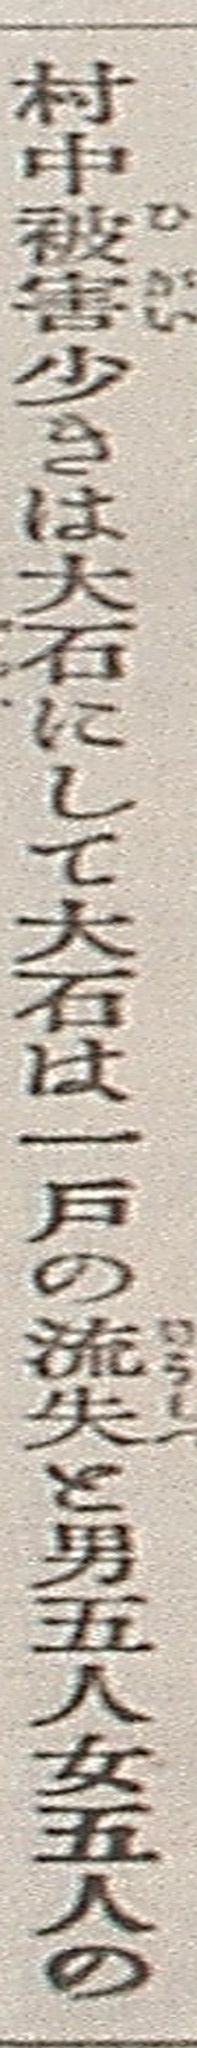村中被害少きは大石にして大石は一戸の流失と男五人女五人の
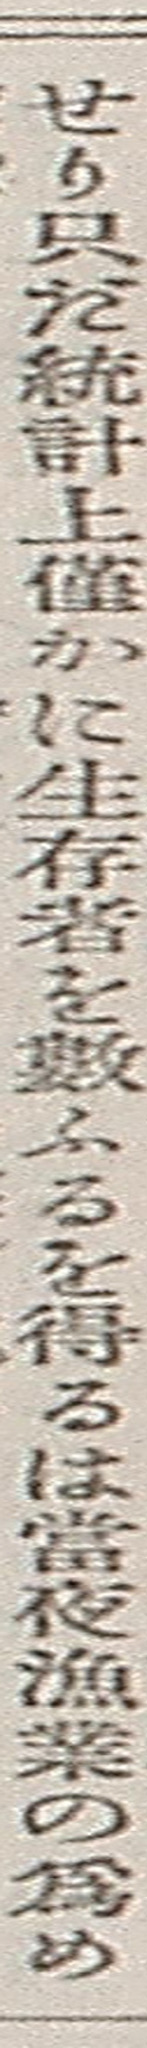せり只だ統計上僅かに生存者を数ふるを得るは当夜漁業の為め
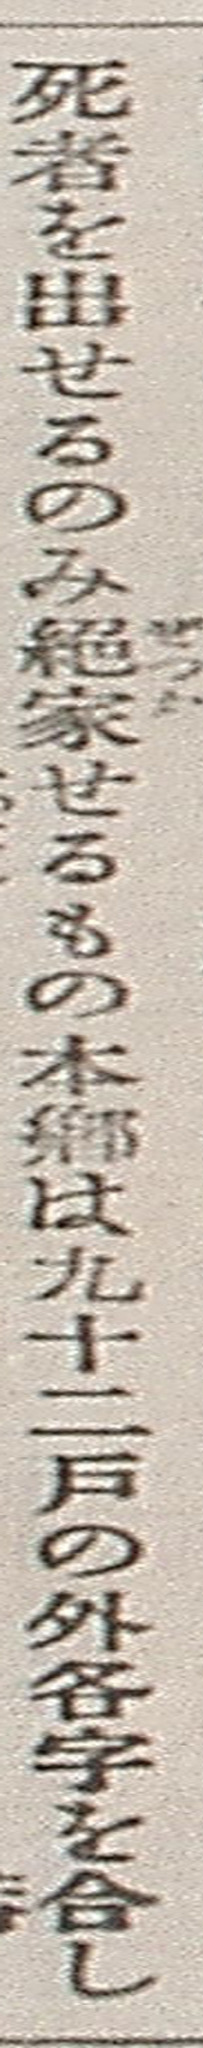死者を出せるのみ絶家せるもの本郷は九十二戸の外各字を合し
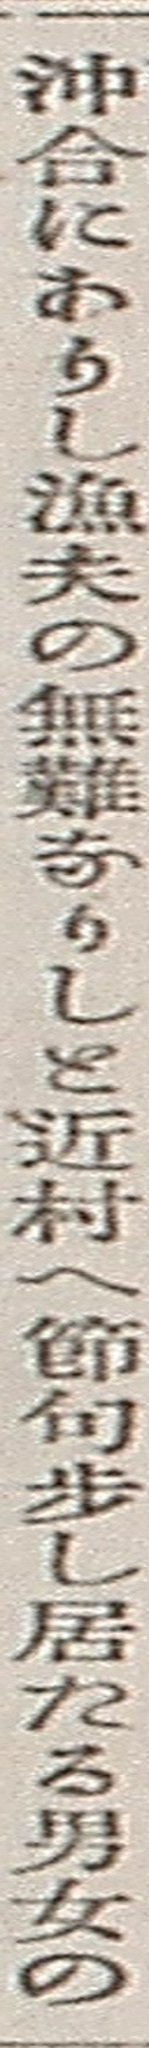沖合にありし漁夫の無難なりしと近村へ節句歩し居たる男女の
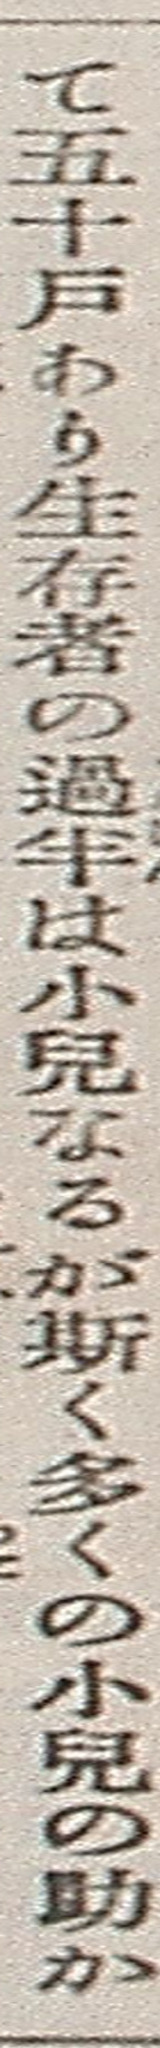て五十戸あり生存者の過半は小児なるが斯く多くの小児の助か
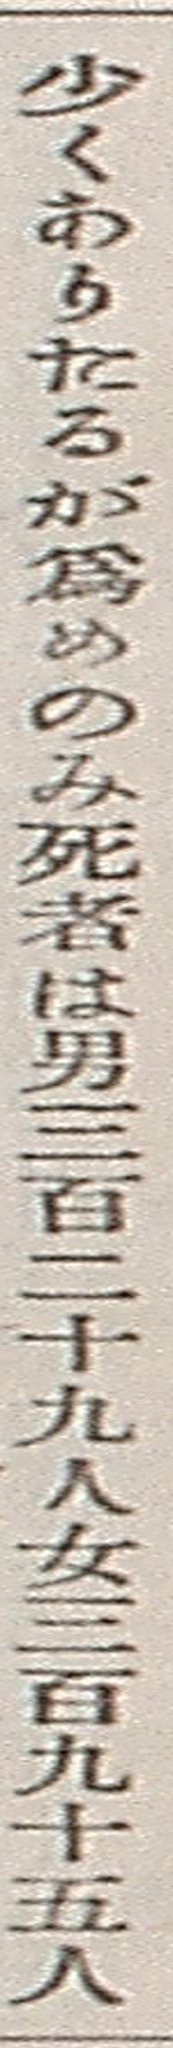少くありたるが為めのみ死者は男三百二十九人女三百九十五人
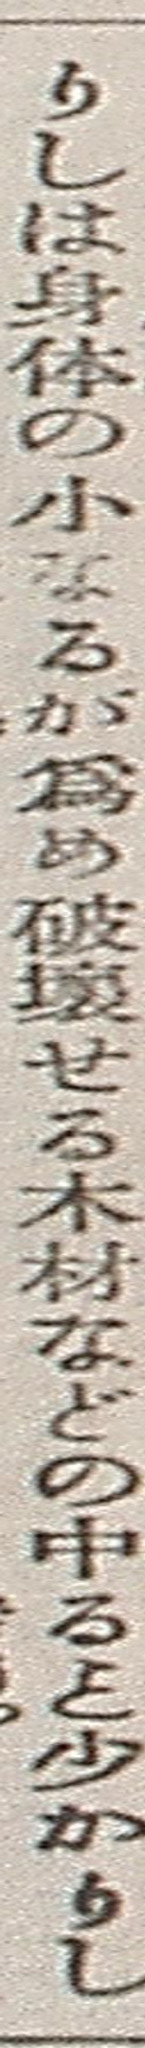りしは身体の小なるが為め破壊せる木材などの中ること少かりし
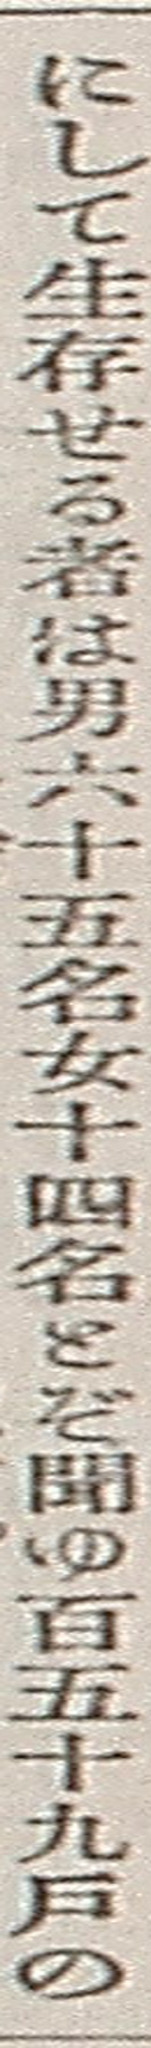にして生存せる者は男六十五名女十四名とぞ聞ゆ百五十九戸の
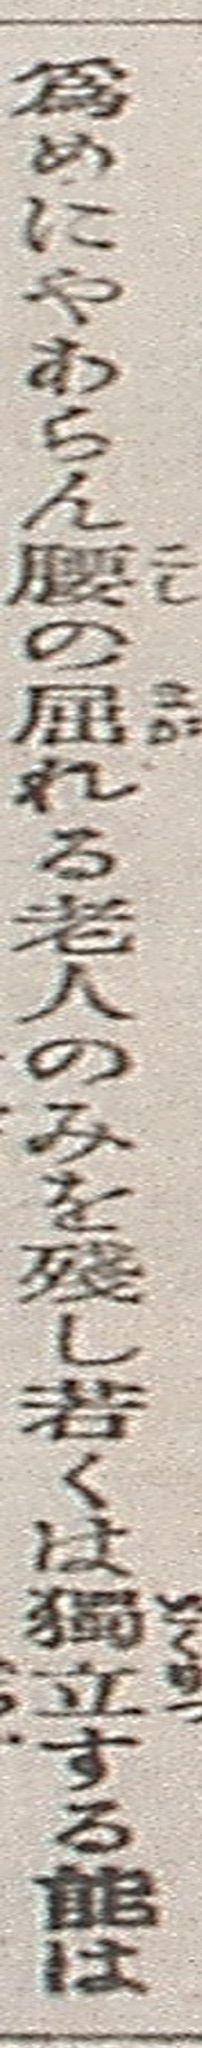為めにやあらん腰の屈れる老人のみを残し若くは独立する能は
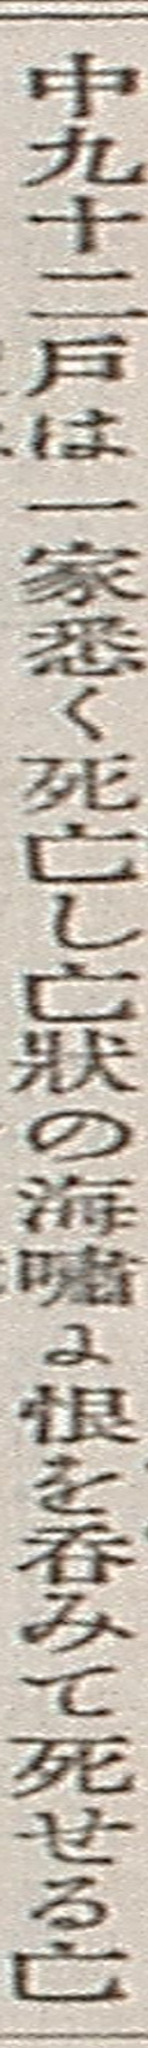中九十二戸は一家悉く死亡し亡状の海嘯に恨を呑みて死せる亡
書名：風俗畫報臨時増刊第百十九號　大海嘯被害録（中）
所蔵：東京大学地震研究所図書室 Earthquake Research Institute Library, The University of Tokyo, JAPAN
